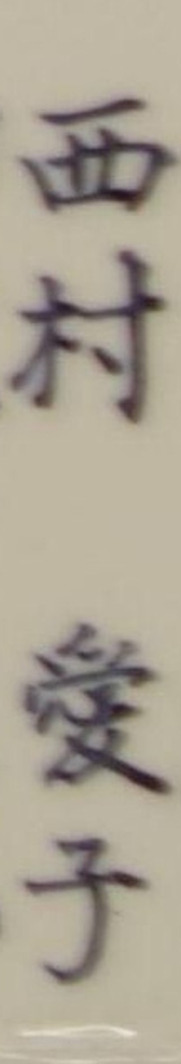西村愛子
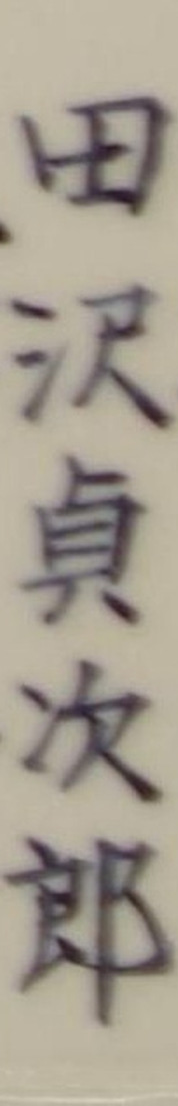田沢貞次郎
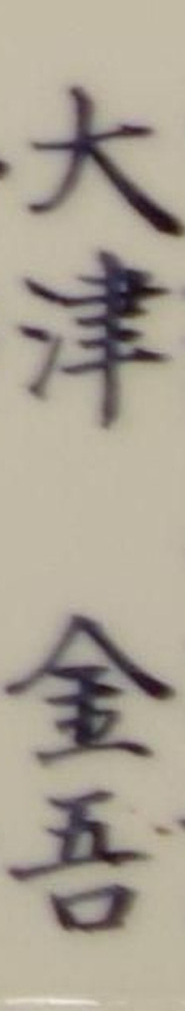大津金吾
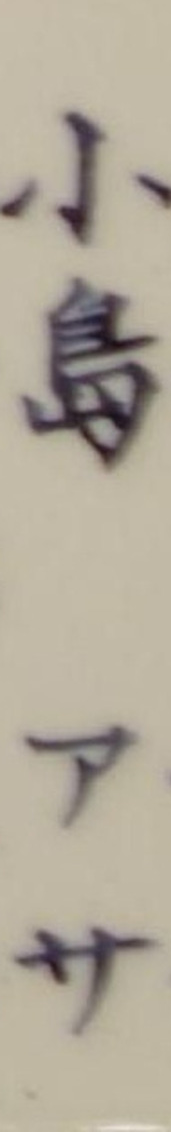小島アサ
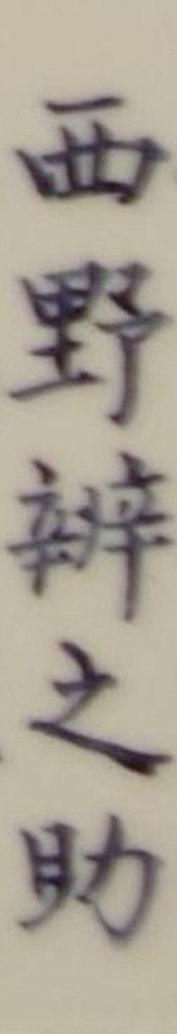西野辨之助
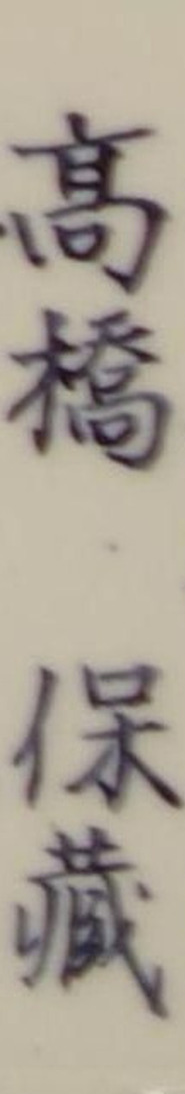高橋保蔵
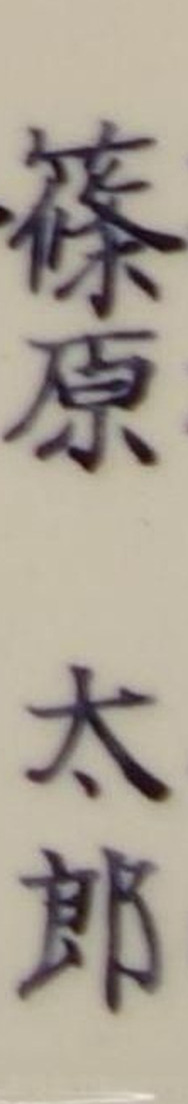篠原太郎
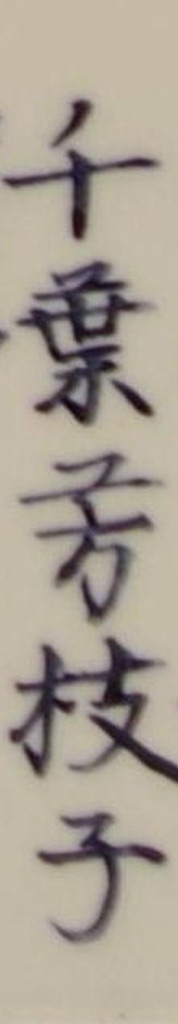千葉芳枝子
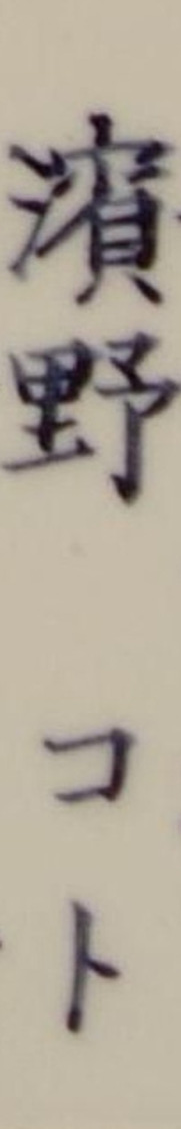浜野コト
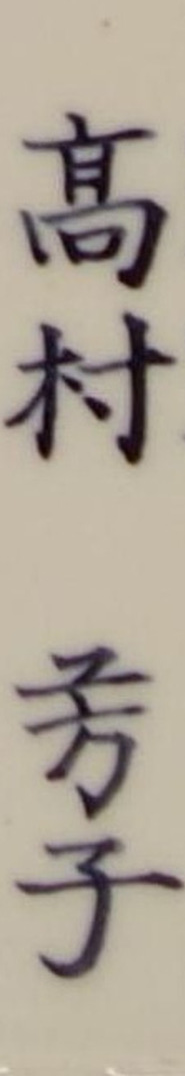高村芳子
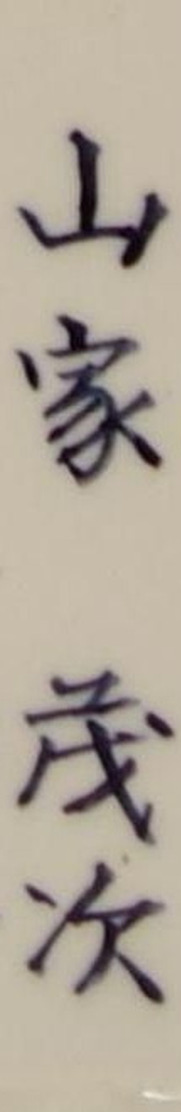山家茂次
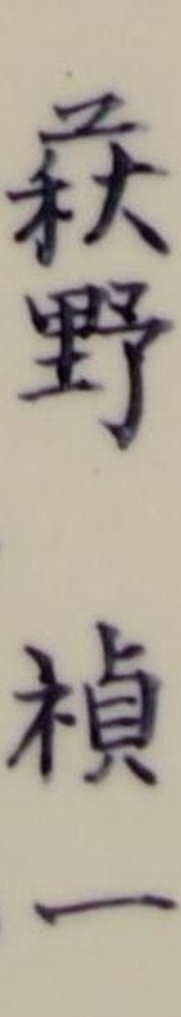萩野禎一
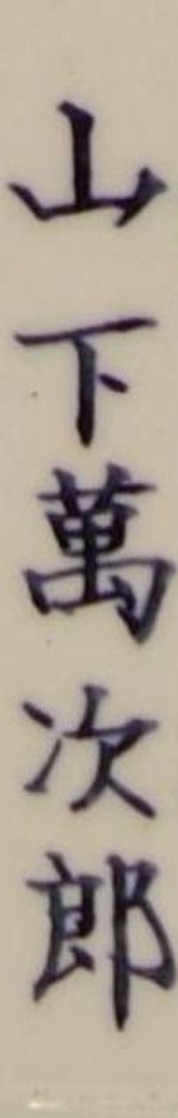山下万次郎
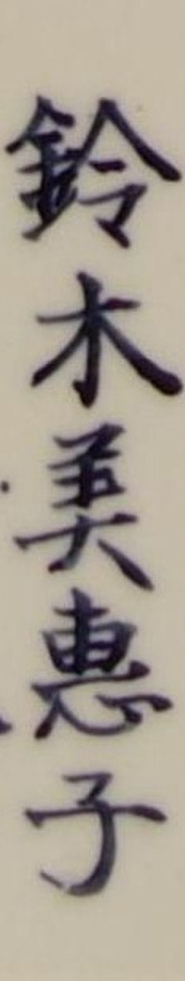鈴木美恵子
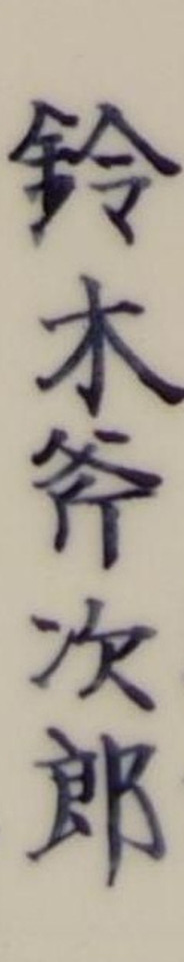鈴木斧次郎

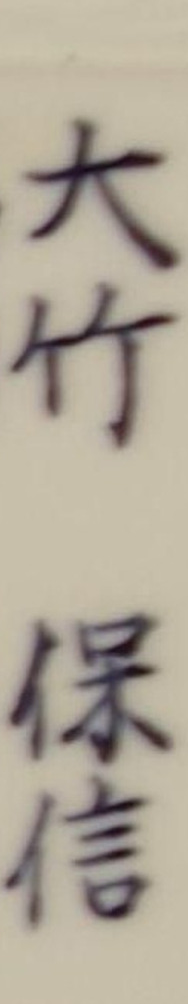大竹保信
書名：M~S
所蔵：高野山金剛峯寺
